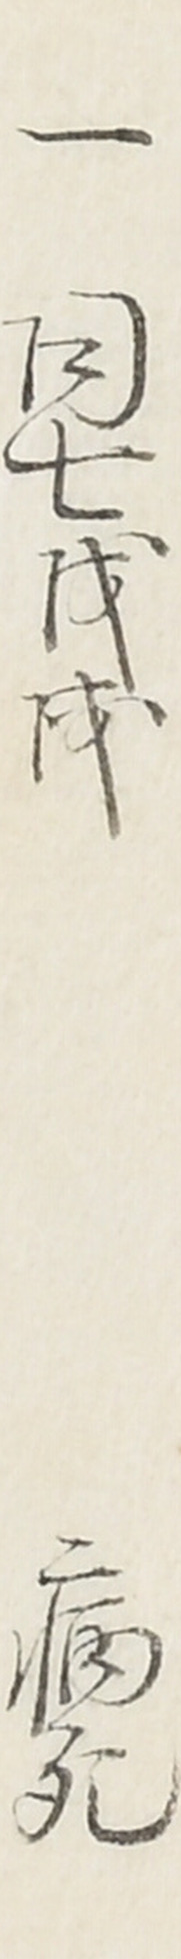一同七戊戌病死
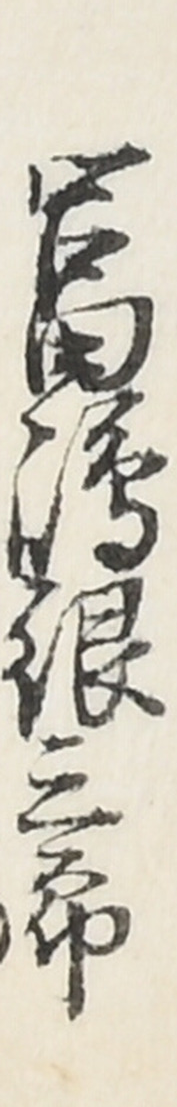冨嶋銀三郎
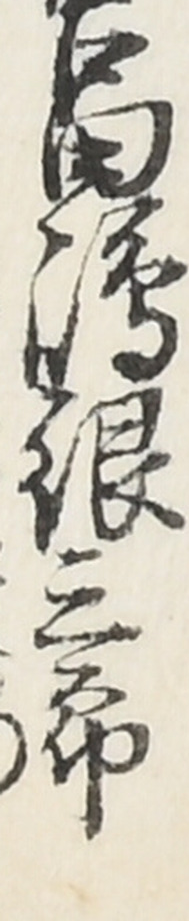冨嶋銀三郎
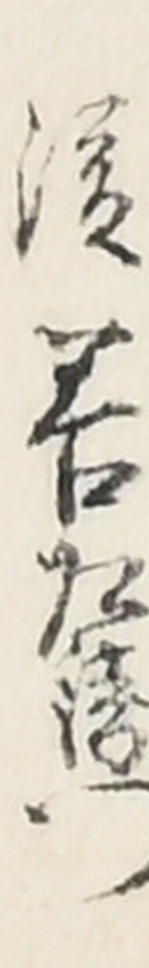後善左衛門

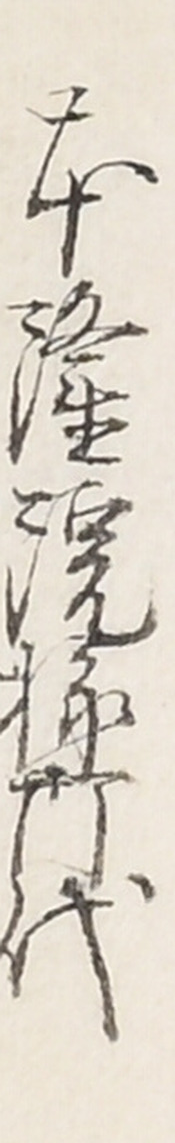本隆院様御代
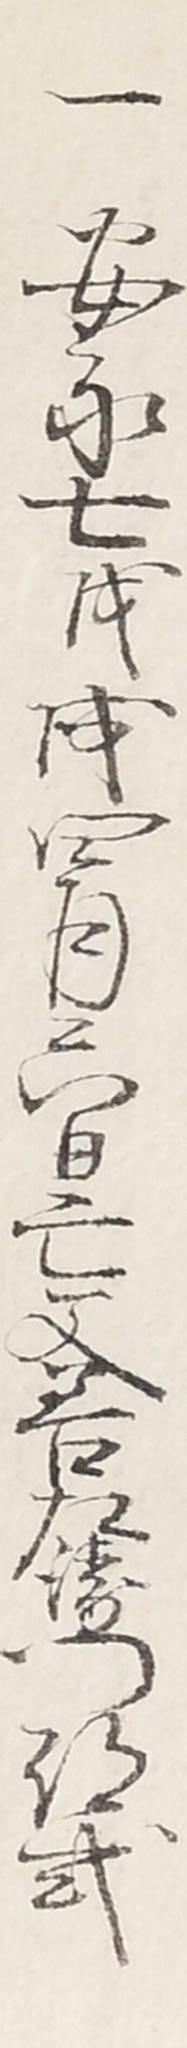一安永七戊戌四月六日亡父善左衛門跡式
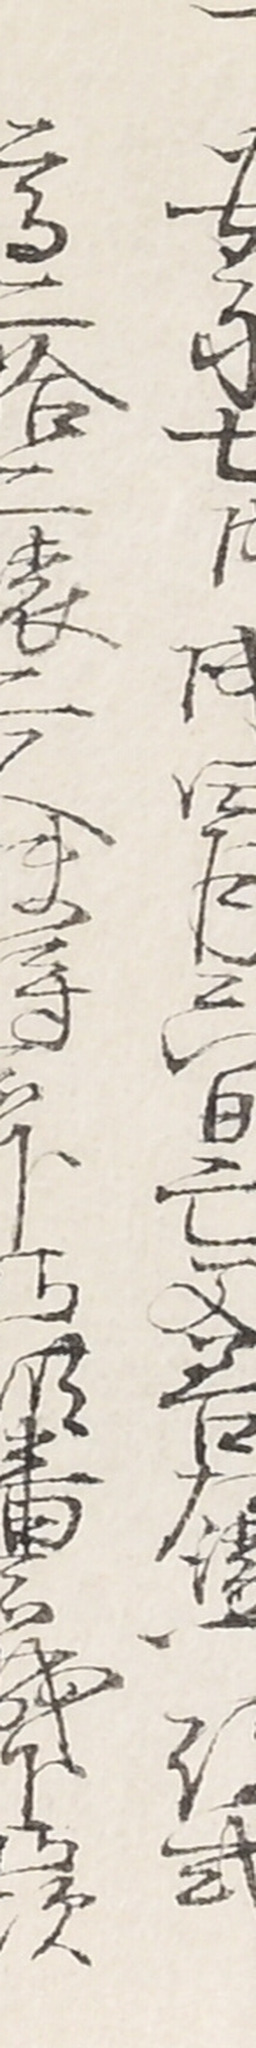高二拾二俵二人扶持被下御供番被成下御次
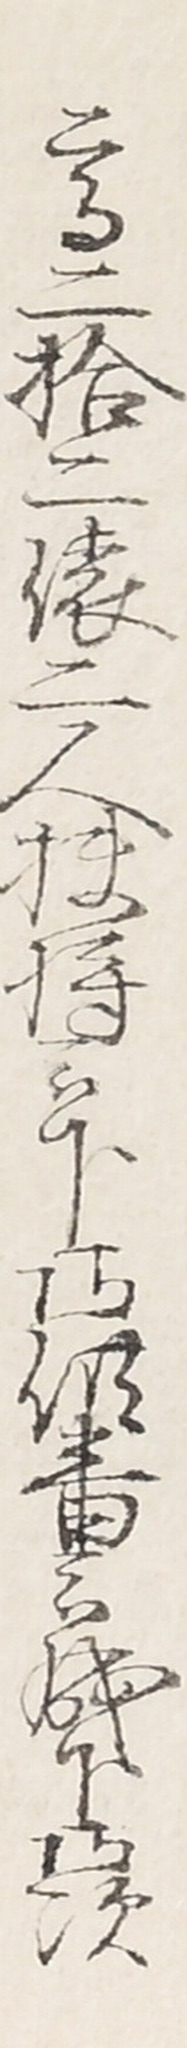高二拾二俵二人扶持被下御供番被成下御次
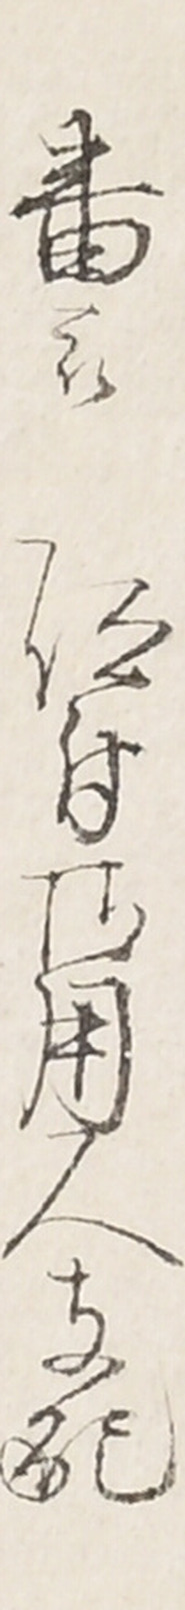番被仰付御用人支配
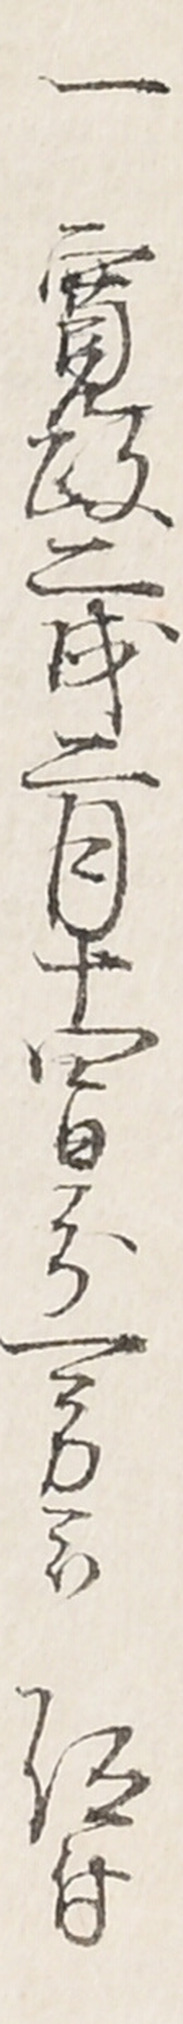一寛政二戌二月十四日分一方被仰付
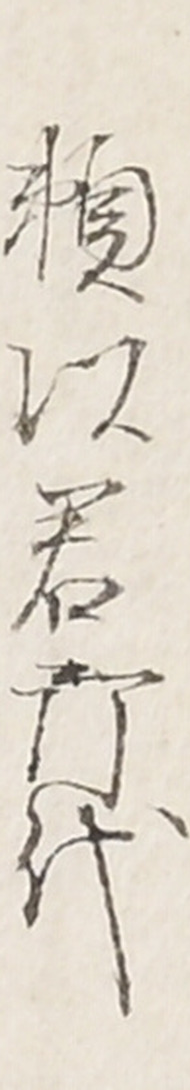頼以君御代
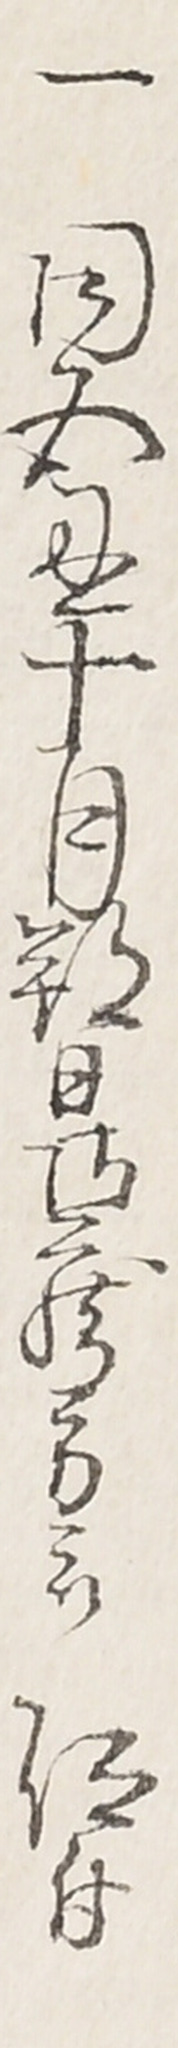一同五丑十月朔日御蔵方被仰付
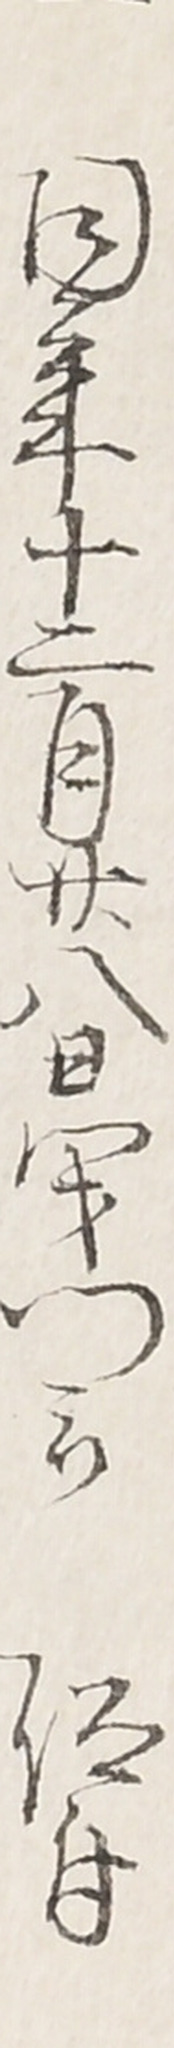一同年十二月廿八日閉門被仰付
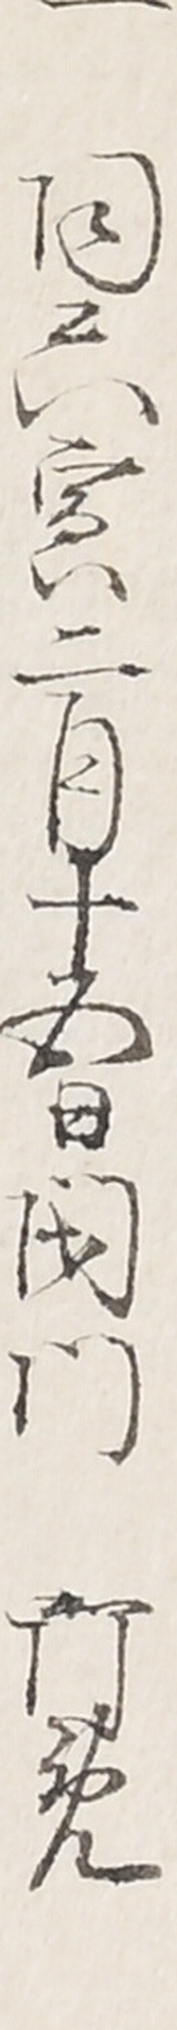一同六寅二月十五日閉門御免
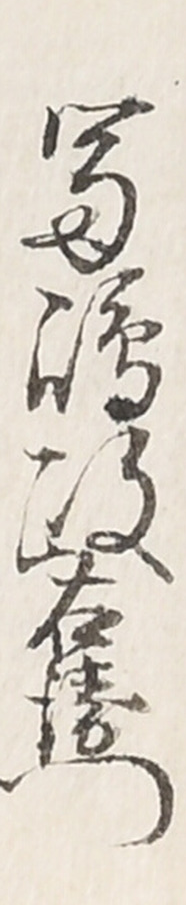冨嶋政右衛門
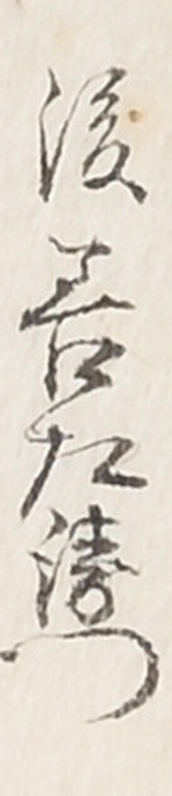後善左衛門
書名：無足諸士勤仕録（四）
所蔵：伊那市立高遠町図書館・合同会社AMANE
